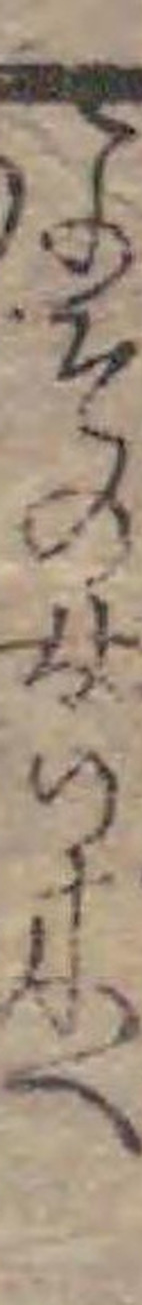よその女の木へ
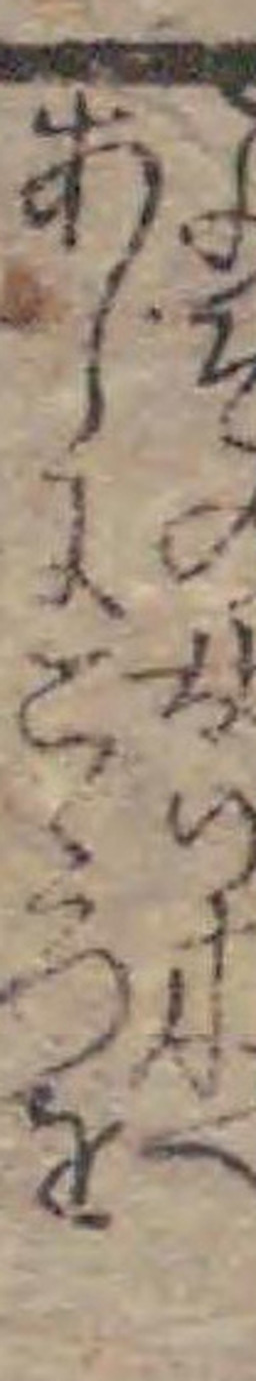あじにこゝろを
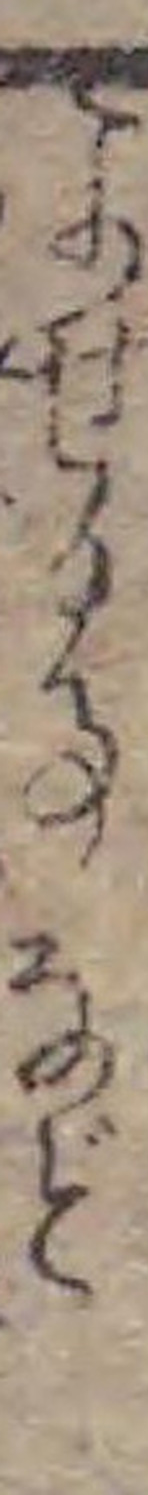よせる事など
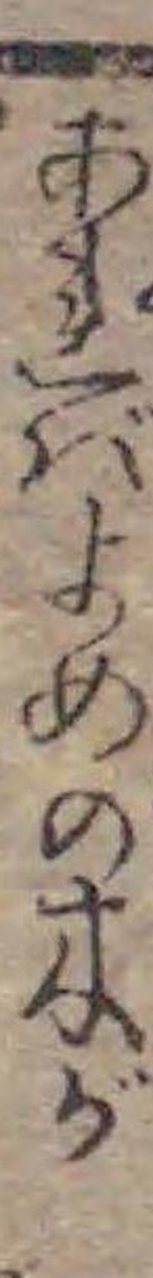あればよめの木が
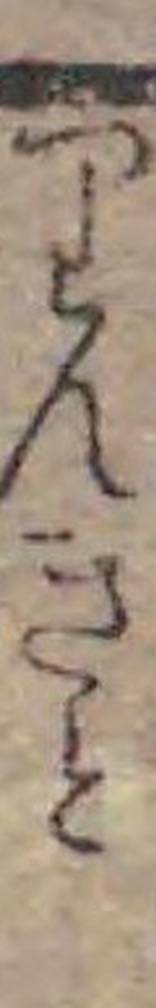りんきと
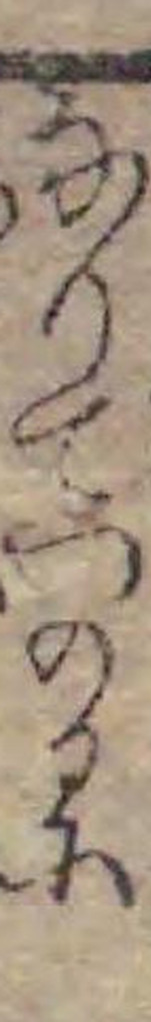なりてつのるに
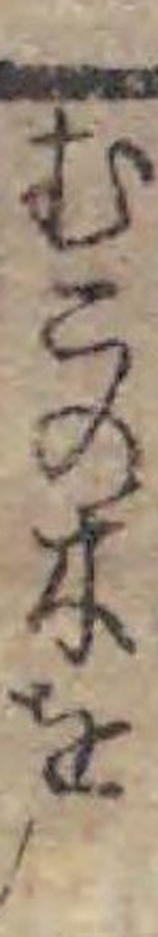むこの木を
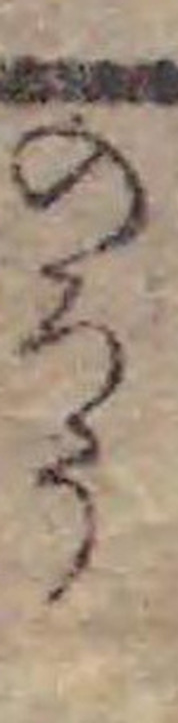のろう
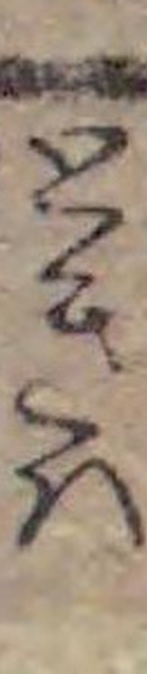ときは
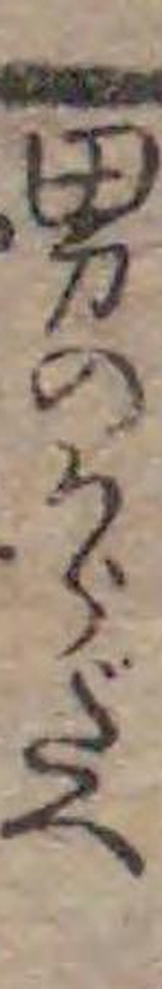男のからだへ
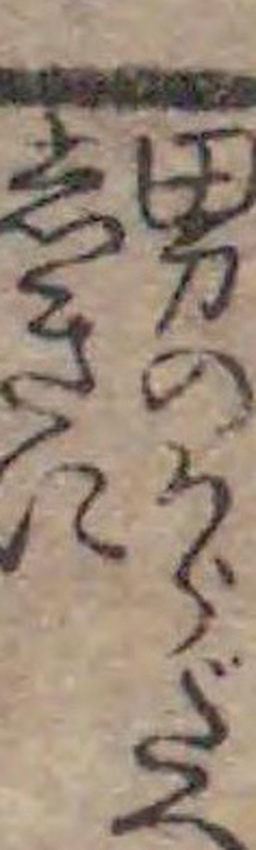しきに
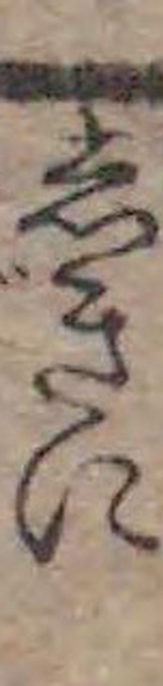しきに
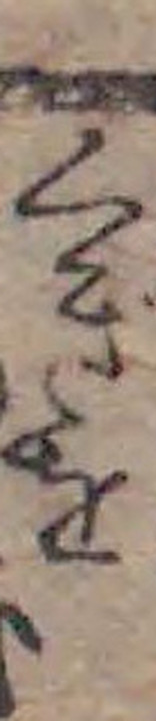くぎを
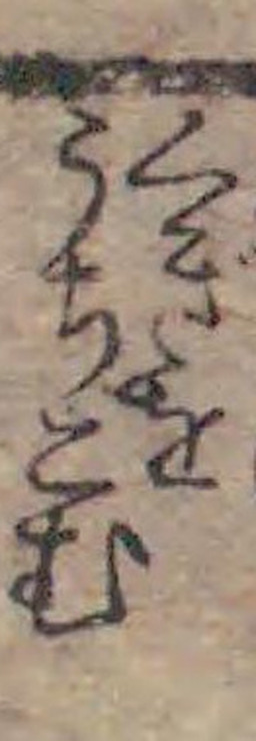うちこむ
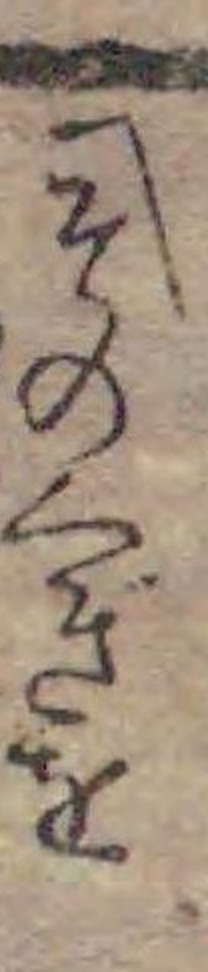〽そのくぎを
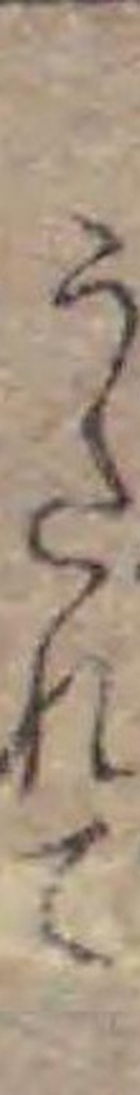うたれて
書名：奇妙頂礼胎錫杖 : 3巻
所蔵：国立国会図書館 National Diet Library, JAPAN
